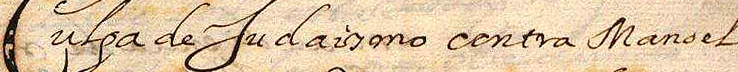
Culpa de Judaismo contra Manoel
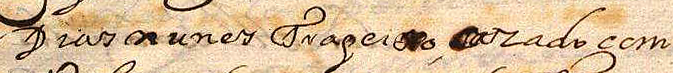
Dias nunes Trapei_o, cazado com
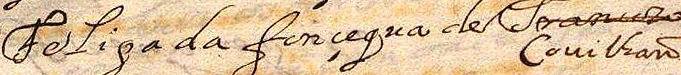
Felipa da fonçequa de Couilhan̄
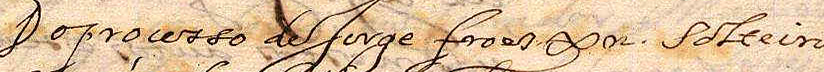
Do proçesso de Jorge froes x n. solteiro
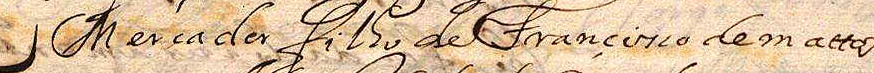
Mercador filho de Françisco de mattos
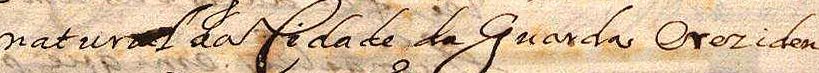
natural da Cidade da Guarda e reziden
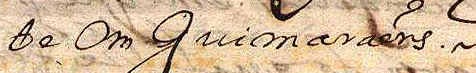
te em Guimaraẽns.
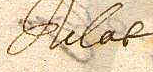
Relat
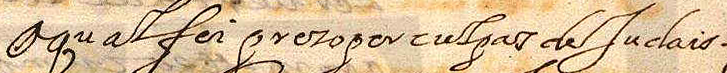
O qual foi prezo por culpas de Judais
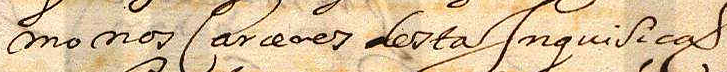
mo nos Carceres desta Jnquisiçaõ
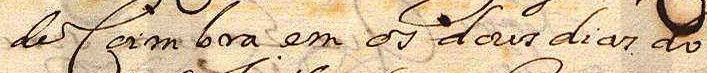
de Coimbra em os dous dias do
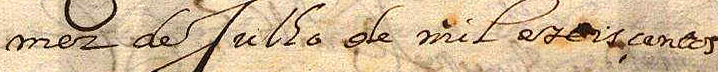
mez de Julho de mil e seisçentos
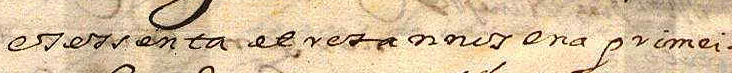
e sessenta e trez annos e na primei
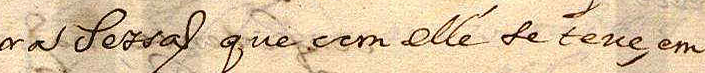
ra sessaõ que com elle se teue, em
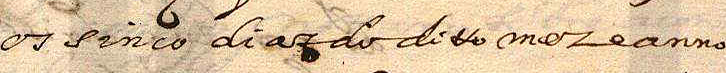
os sinco dias do ditto mez e anno
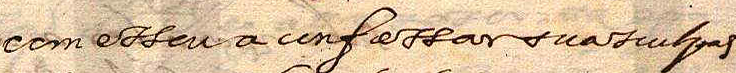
comessou a confessar suas culpas
